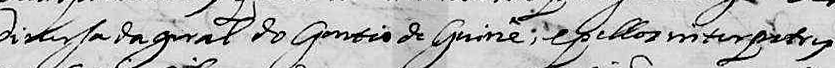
diuersa da geral do Gentio de Guinê, e pellos interpetres
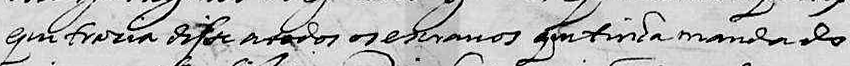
que trazia disse a todos os escrauos que tinha mandado
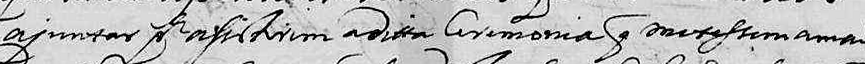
ajuntar pa asistirem a ditta Ceremonia q̄ metessem a maõ
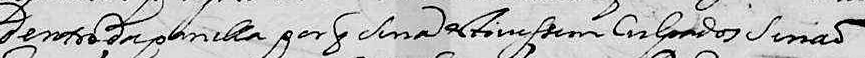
dentro da panella porq̄ se naõ estiuessem culpados se naõ
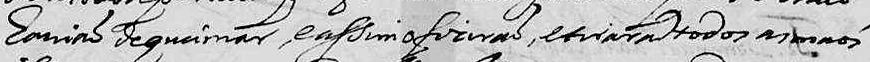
hauiaõ de queimar, e assim o fizeraõ, e tiraraõ todos as maos̄
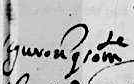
gurou q̄ somte
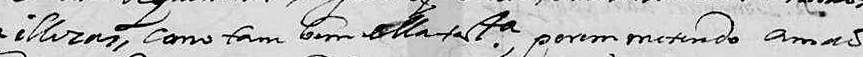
illezas, como tambem ella test.a, porem metendo a maõ
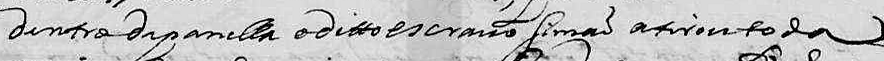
dentro de panella o ditto escrauo simaõ a tirou toda
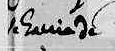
se hauia de
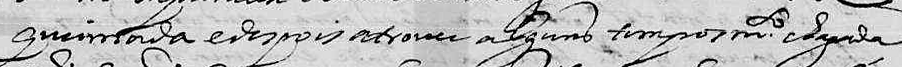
queimada e despois a trouce alguns̄ tempos m.to chagada
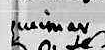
queimar
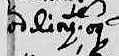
o delinq.te o q̄
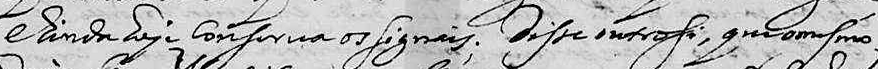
e hinda hoje conserua os signais. disse outrosi, que o mesmo
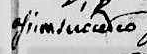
assim succedeo
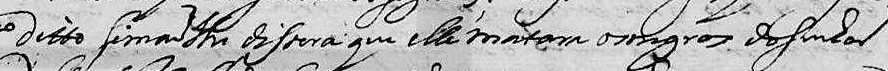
ditto simaõ lhe dissera que elle matara o sogros do senhor
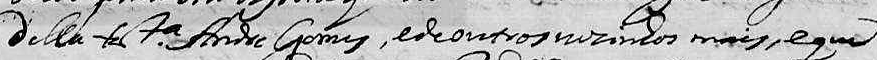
della test.a Andre Gomes, e de outros uizinhos mais, e que
